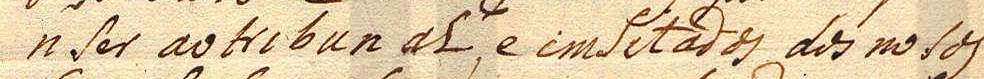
nser ao tribunaL, e imSitados dos nosos
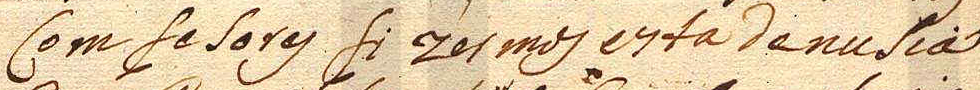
Comfesores fizermos esta denusia
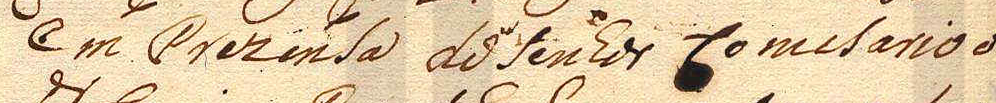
em Prezensa do senhor Comisario o
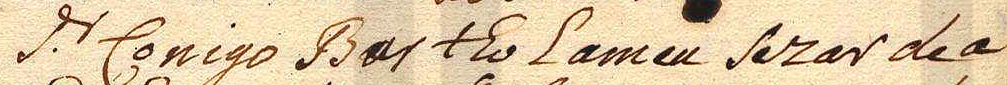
s.or Conigo BarthoLameu sezar de a
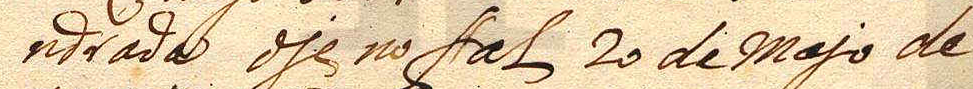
ndrada oje no faL 20 de majo de
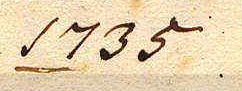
1735
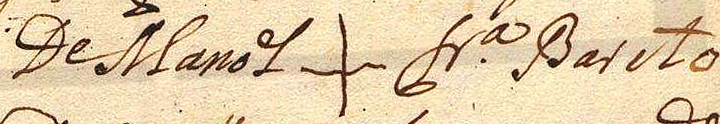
De ManoeL + fr.a Bareto
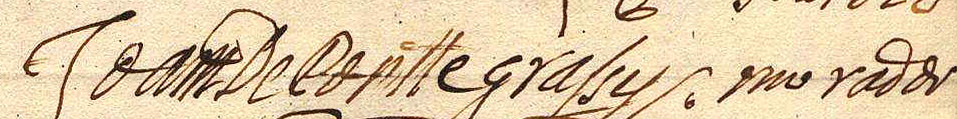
Joam De Pontte grasses. morador
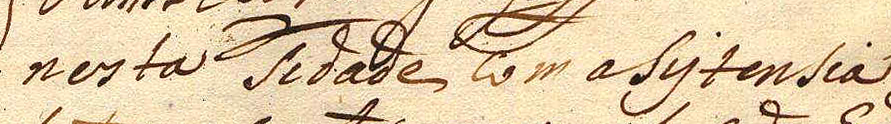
nesta sidade com asistensia
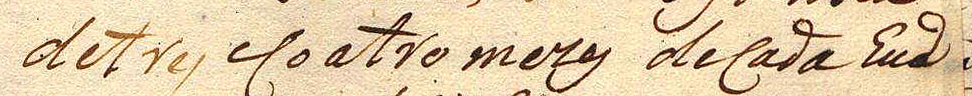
de tres e Coatro mezes de Cada huā
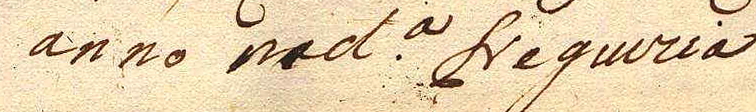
anno na d.a freguezia
